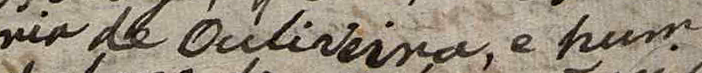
ria de Oliveira, e hum
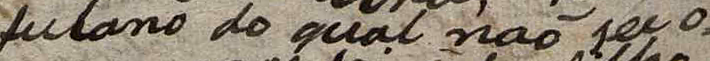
fulano do qual naõ sei o
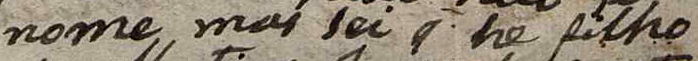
nome mas sei q̄ é filho
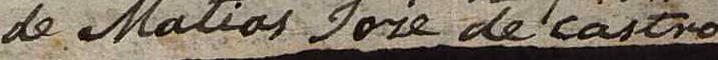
de Matias Joze de Castro
